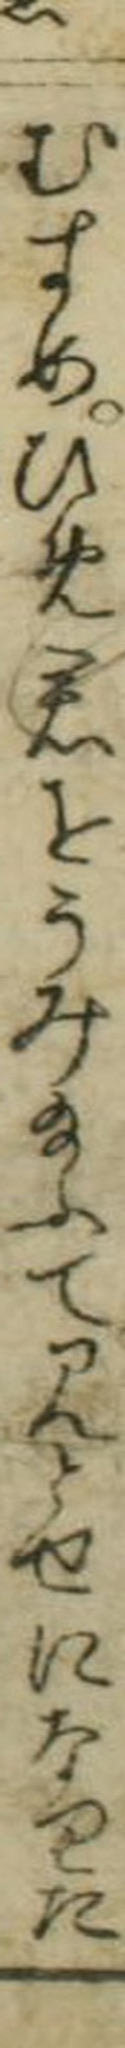むすめ。ひめ君をうみ給ふて。みとせになりた
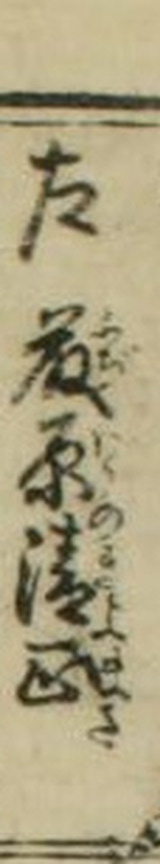左藤原清正
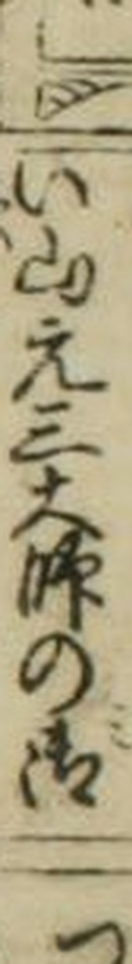い山元三大師の御
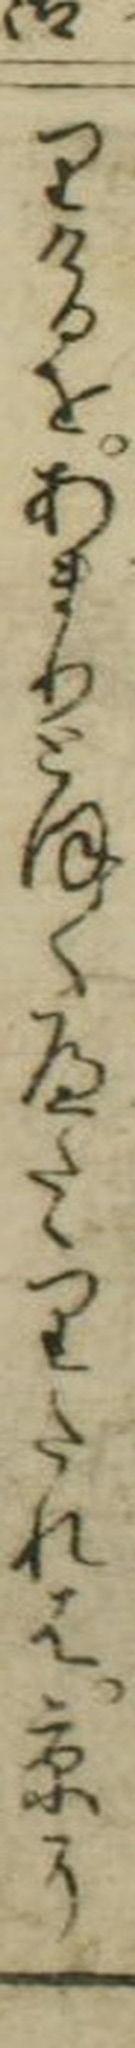りけるを。あまりとほくへたゝりたれは。京に
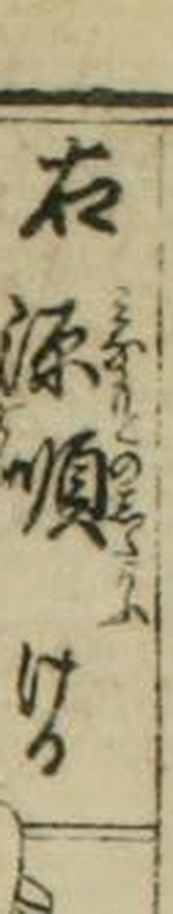右源順ける
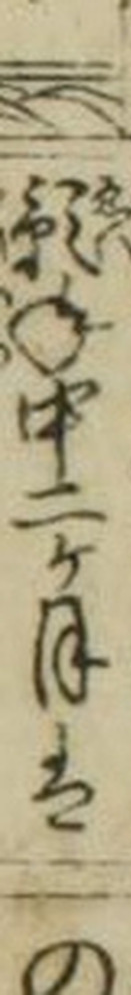影年中二ヶ月は
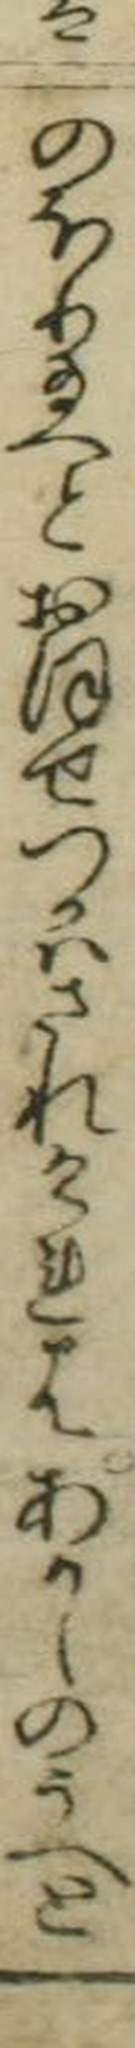のほり給へとおほせつかはされけれは。あかしのうへと
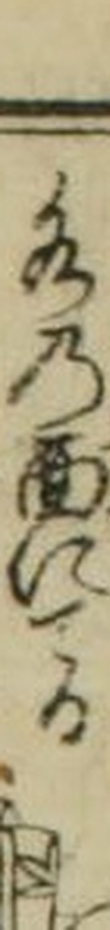水の面にてる
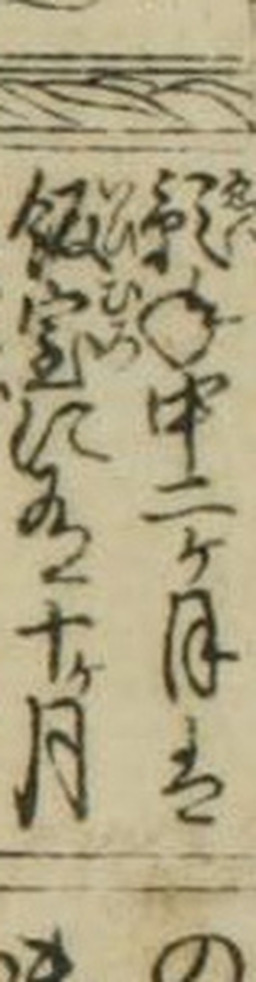飯室に有十ヶ月
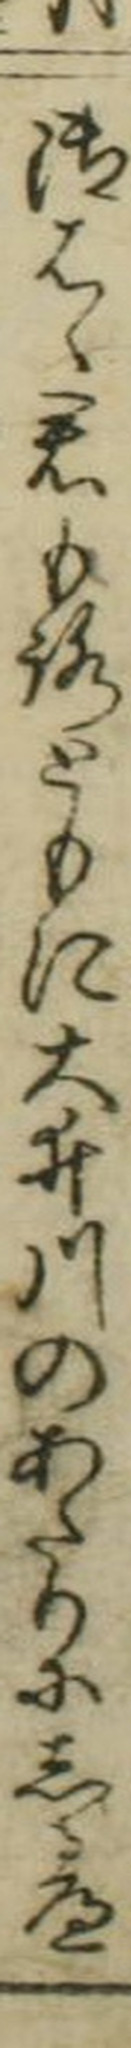御はゝ君もろともに大井川のあたりにしるへ
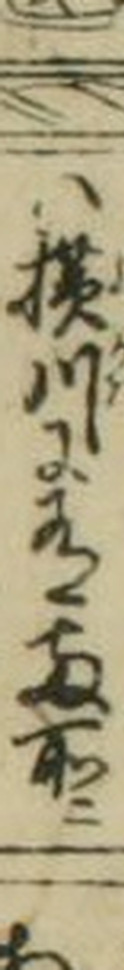は横川に有両所に
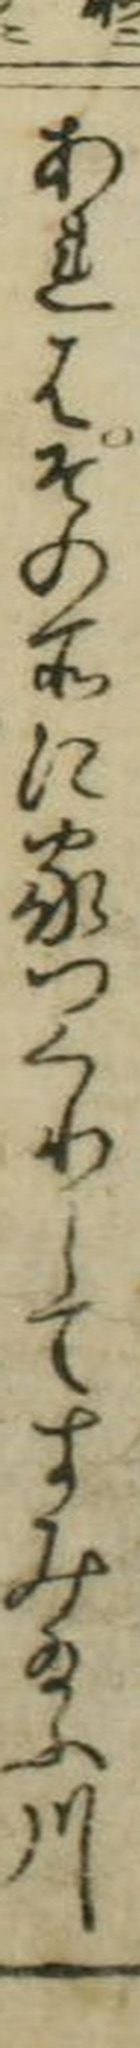あれは。その所に家つくりしてすみ給ふ川
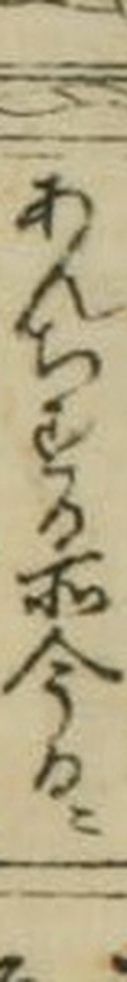あんちする所今日に
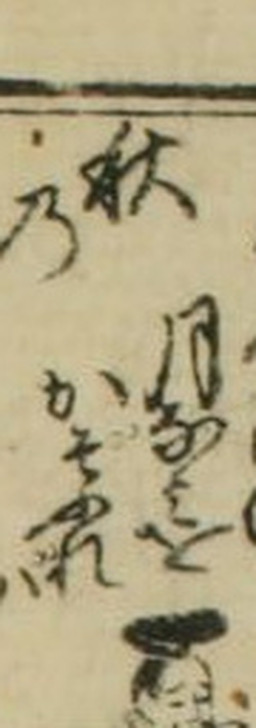秋かぞふれ
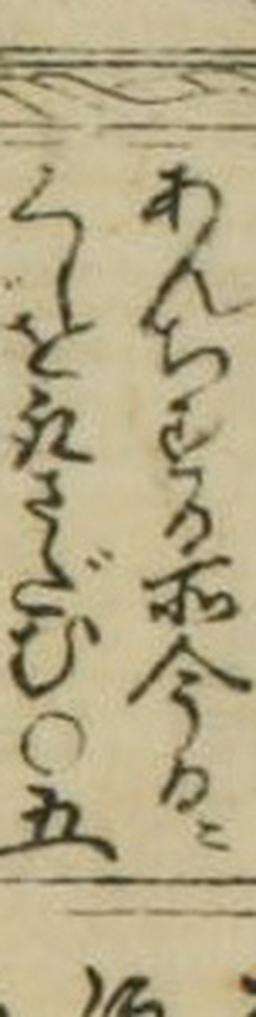くしを取さだむ○五
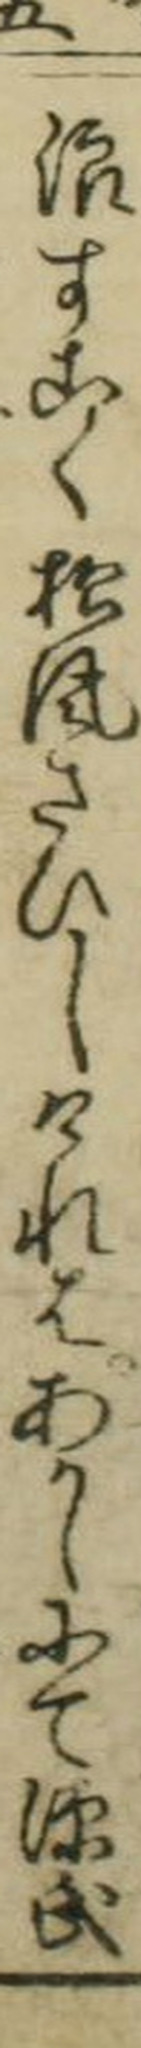流すこく松風さひしけれは。あかしにて源氏
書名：女源氏教訓鑑
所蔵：東京学芸大学附属図書館
